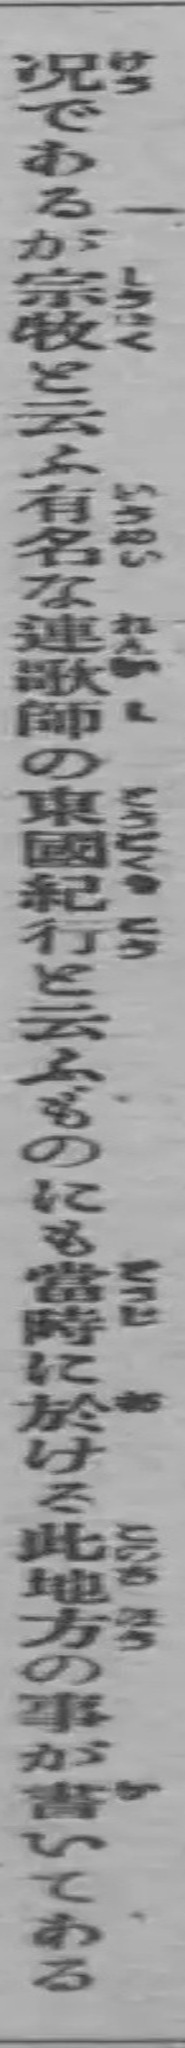況であるが宗牧と云ふ有名な連歌師の東国紀行と云ふものにも当時に於ける此地方の事が書いてある
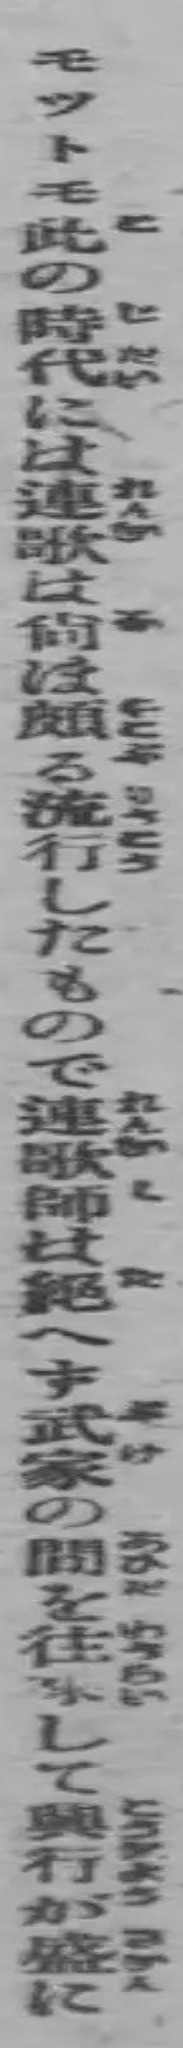モツトモ此の時代には連歌は尚ほ頗る流行したもので連歌師は絶へず武家の間を往来して興行が盛に
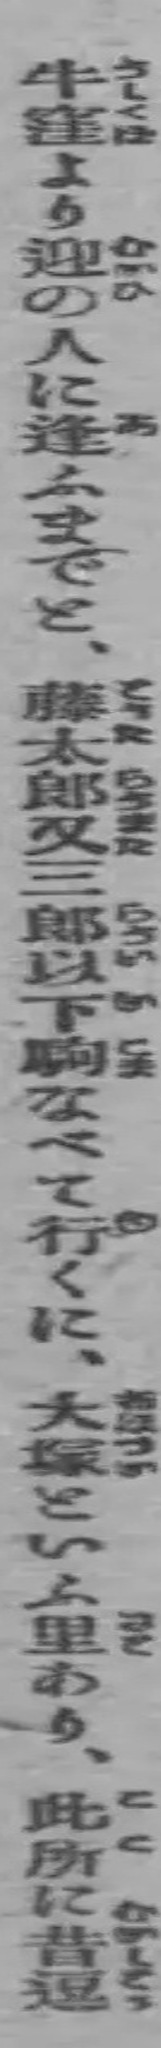牛窪より迎の人に逢ふまでと、藤太郎又三郎以下駒なべて行くに、大塚といふ里あり、此所に昔逗

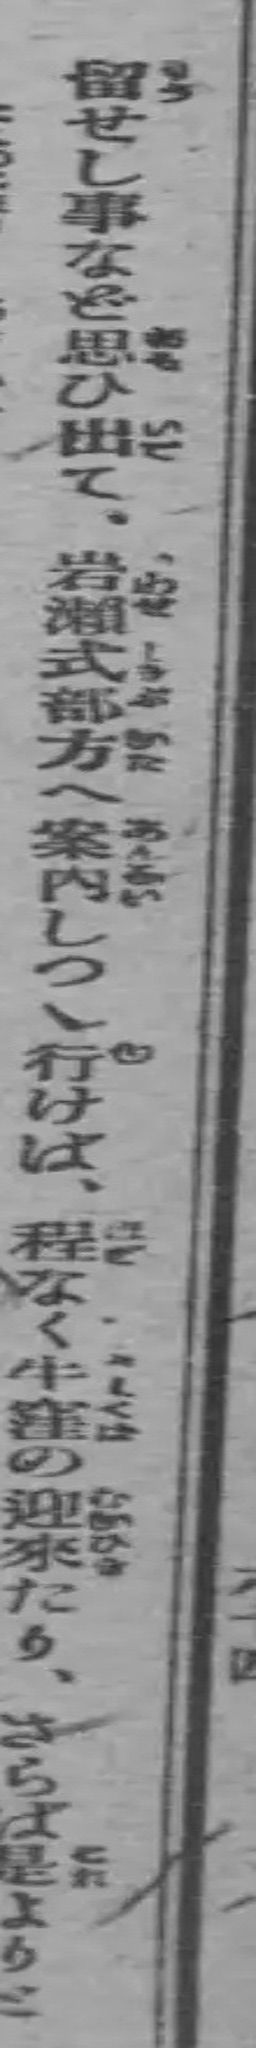留せし事など思ひ出て、岩瀬式部方へ案内しつゝ行けば、程なく牛窪の迎来たり、さらば是よりと
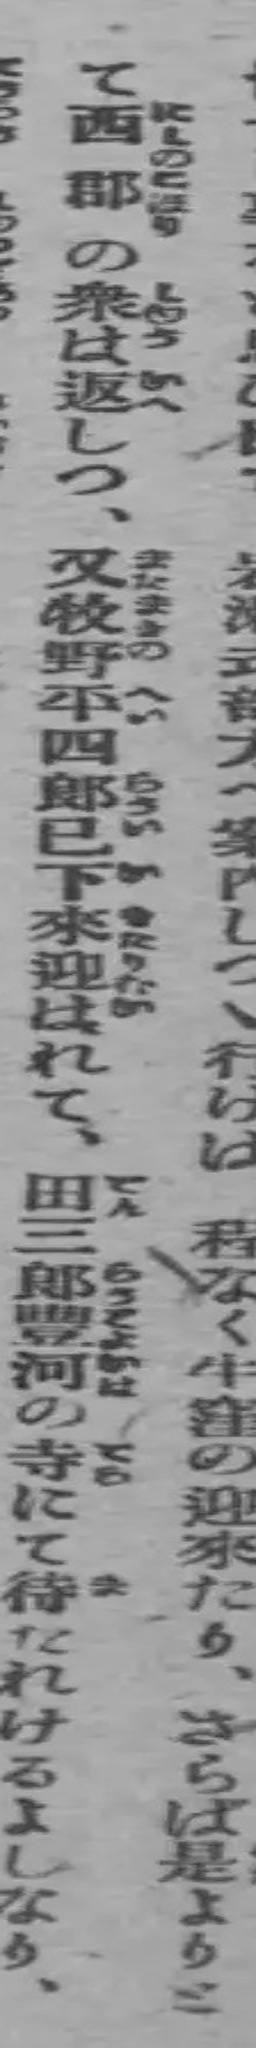て西郡の衆は返しつ、又牧野平四郎已下来迎はれて、田三郎豊河の寺にて待たれけるよしなり、
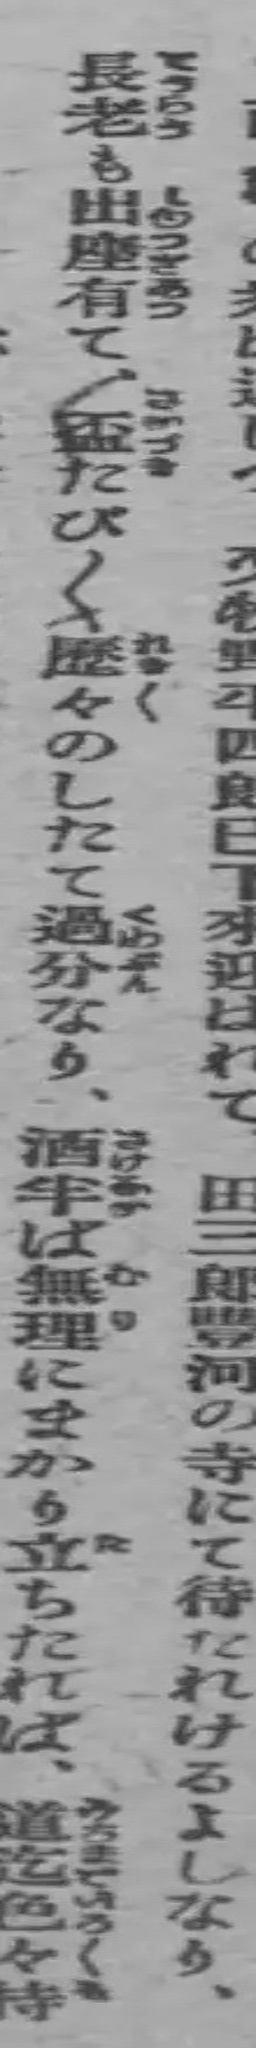長老も出座有て、盃たび〳〵歴々のしたて過分なり、酒半ば無理にまかり立ちたれば、道迄色々持
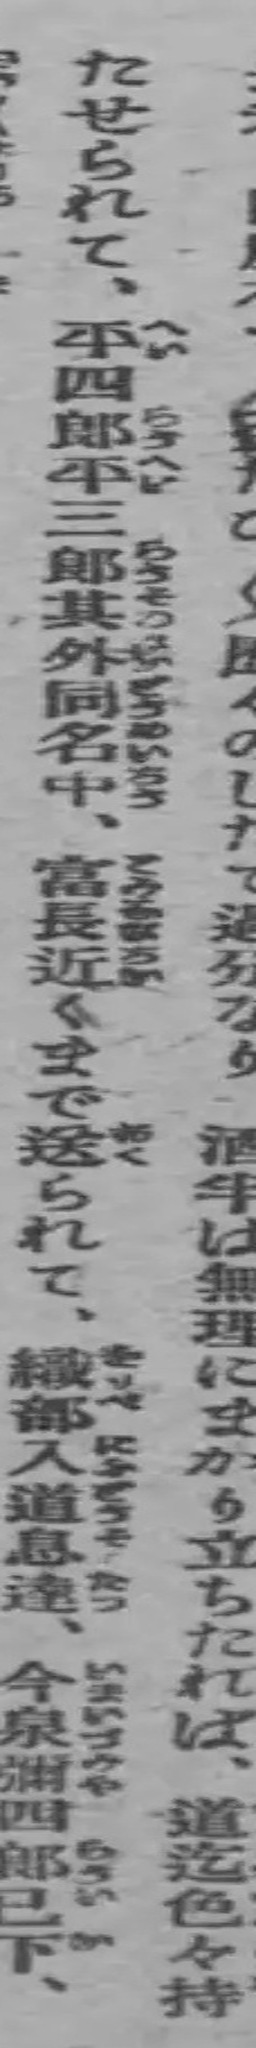たせられて、平四郎平三郎其外同名中、富長近くまで送られて、織部入道息達、今泉弥四郎已下、
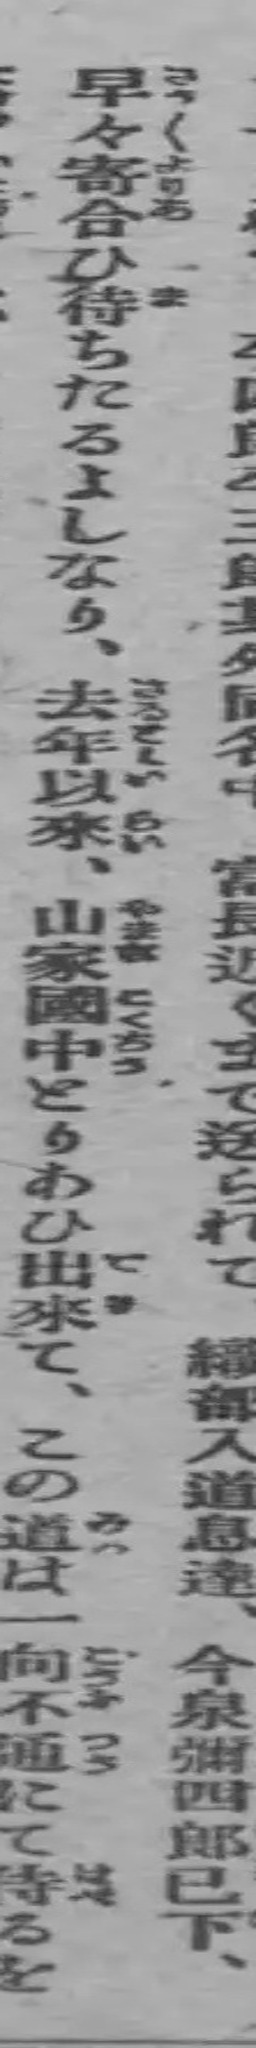早々寄合ひ待ちたるよしなり、去年以来、山家国中とりあひ出来て、この道は一向不通にて侍るを
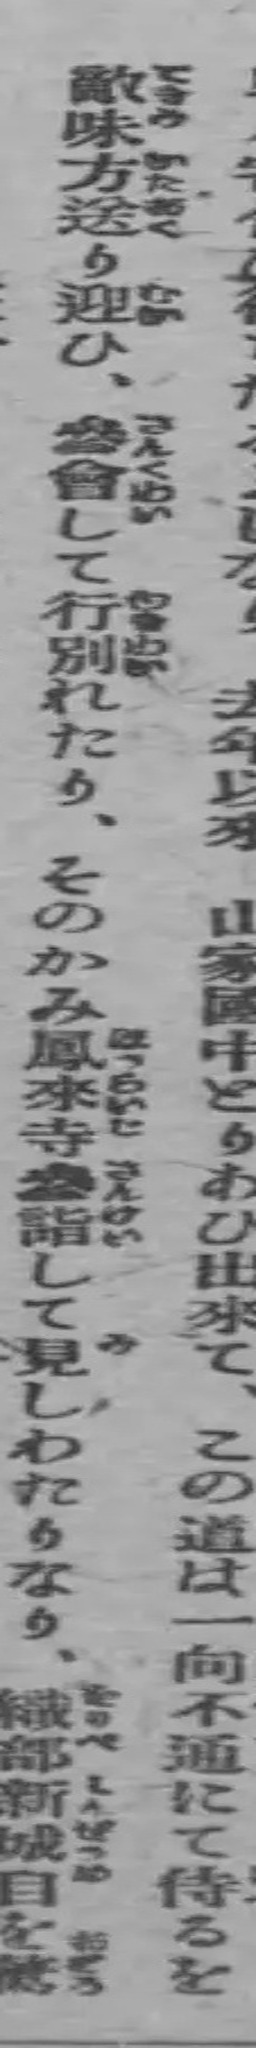敵味方送り迎ひ、参会して行別れたり、そのかみ鳳来寺参詣して見しわたりなり、織部新城目を驚
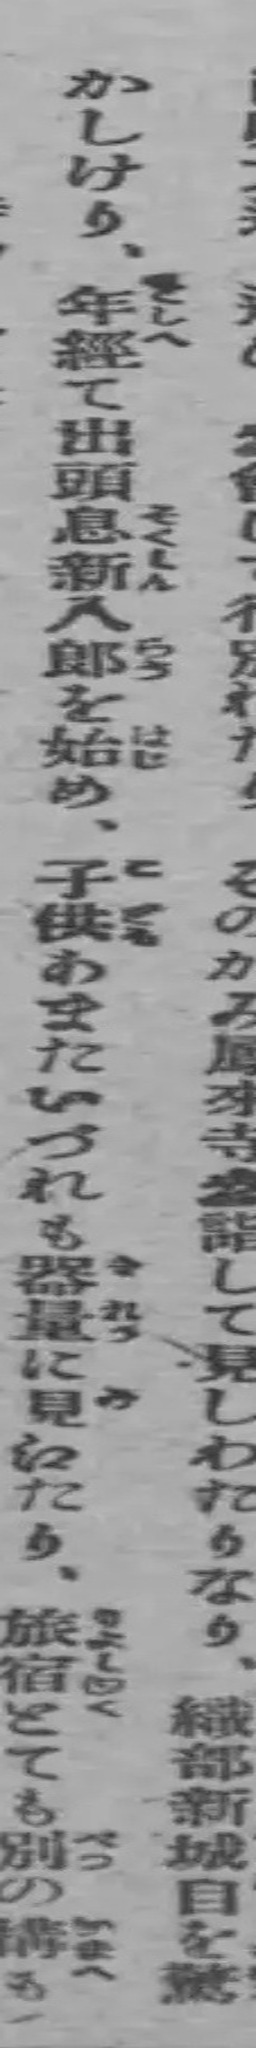かしけり、年経て出頭息新八郎を始め、子供あまたいづれも器量に見えたり、旅宿とても別の搆も
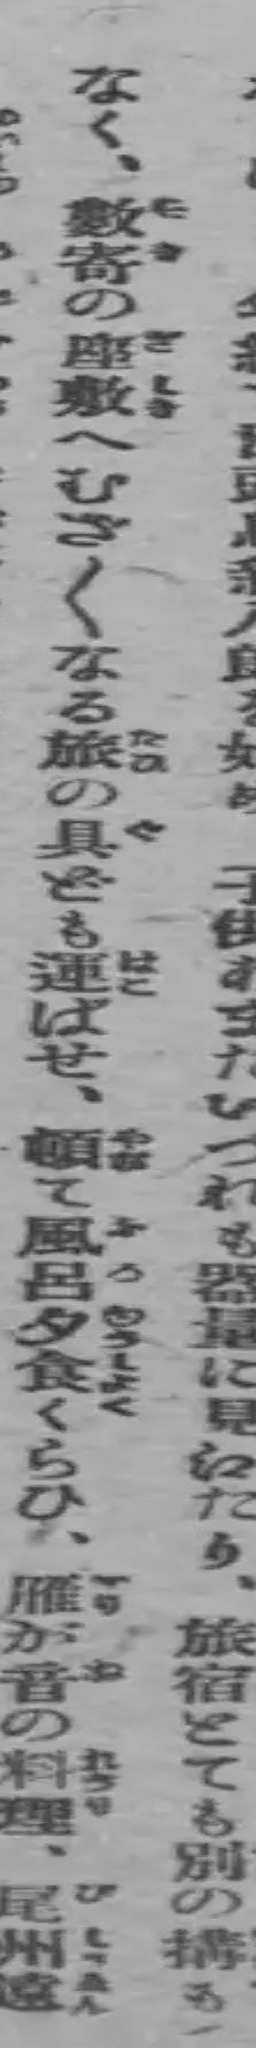なく、数寄の座敷へむざ〳〵なる旅の具ども運ばせ、頓て風呂夕食くらひ、雁が音の料理、尾州遠
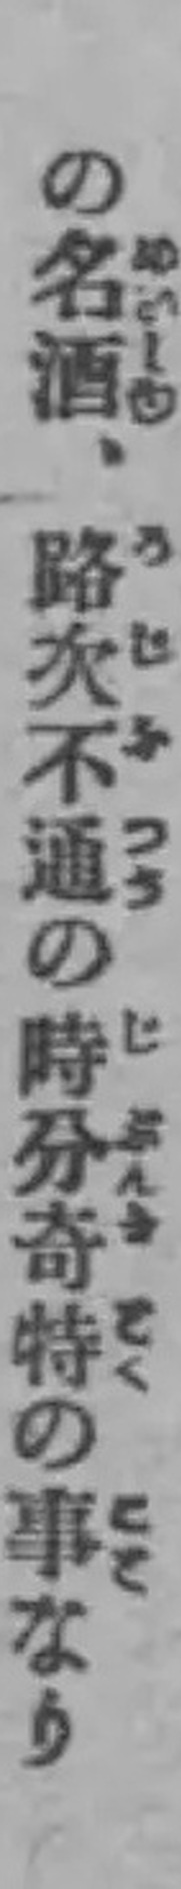の名酒、路次不通の時分奇特の事なり
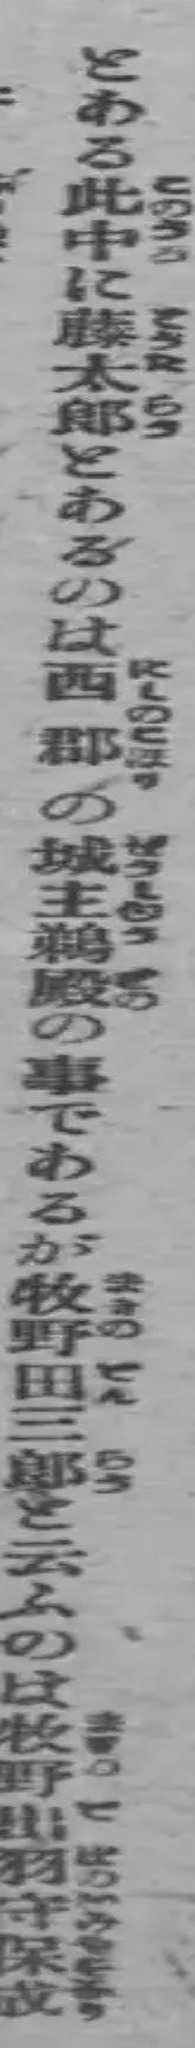とある此中に藤太郎とあるのは西郡の城主鵜殿の事であるが牧野田三郎と云ふのは牧野出羽守保成
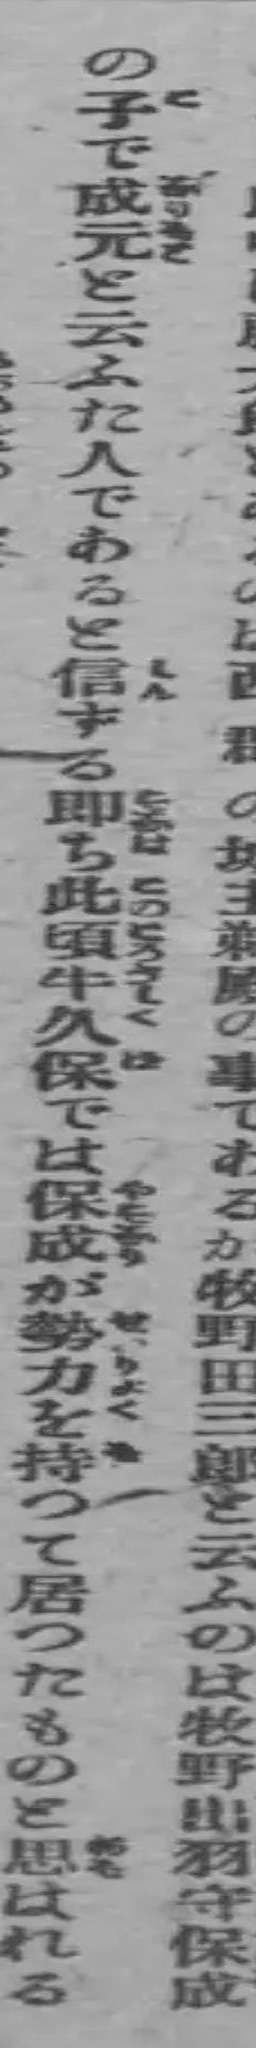牧野保成の子で成元と云ふた人であると信ずる即ち此頃牛久保では保成が勢力を持つて居つたものと思はれる
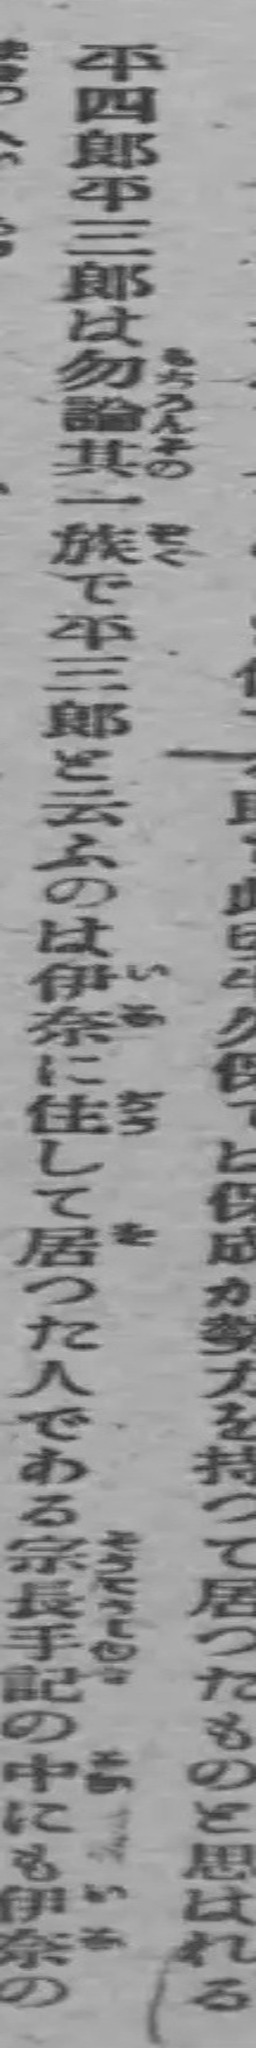平四郎平三郎は勿論其一族で平三郎と云ふのは伊奈に住して居つた人である宗長手記の中にも伊奈の
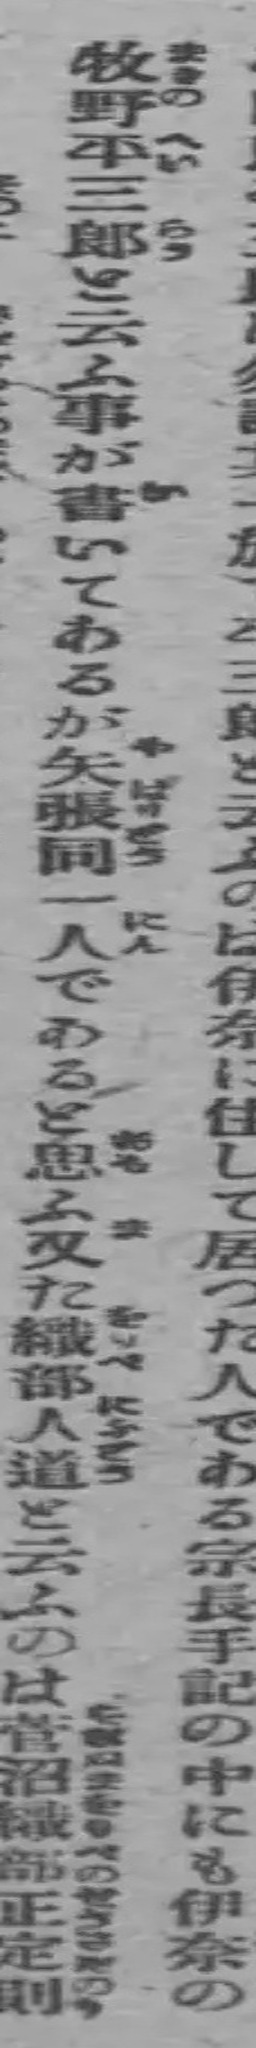牧野平三郎と云ふこと事が書いてあるが矢張同一人であると思ふ又た織部入道と云のは菅沼織部正定則
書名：豊橋市史談
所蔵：国立国会図書館 National Diet Library, JAPAN
